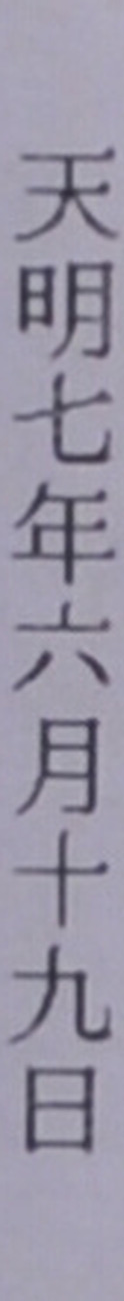天明七年六月十九日
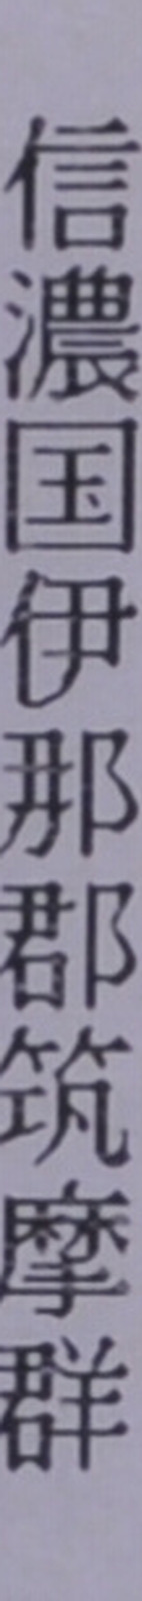信濃国伊那郡筑摩群
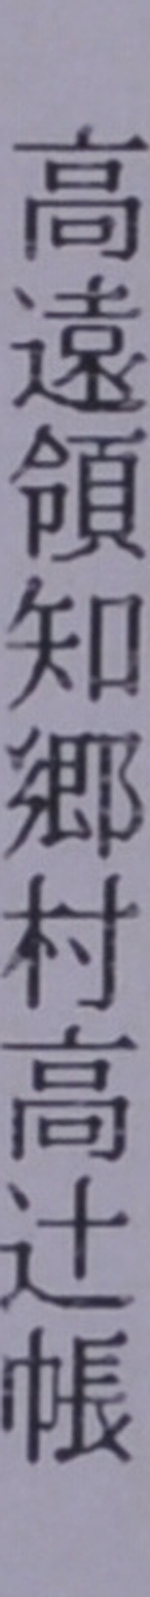高遠領知郷村高辻帳
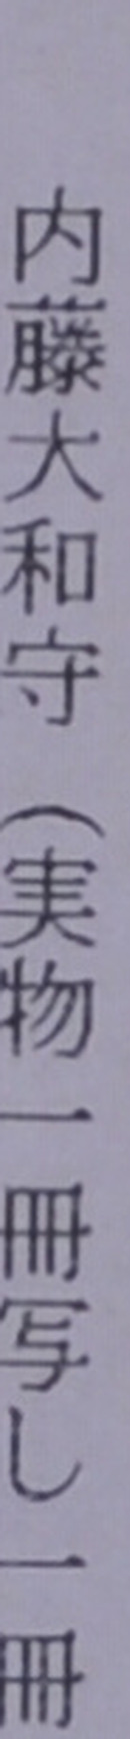内藤大和守(実物一冊写し一冊)
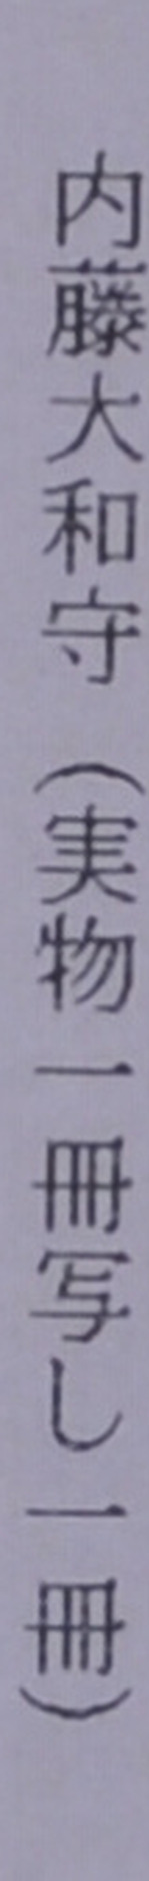内藤大和守(実物一冊写し一冊)
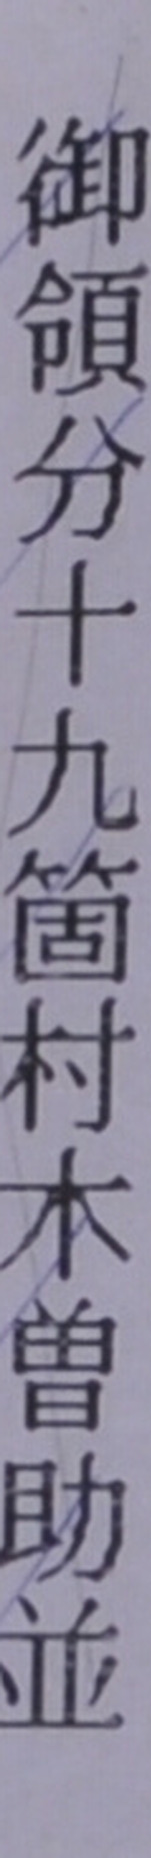御領分十九箇村木曾助並
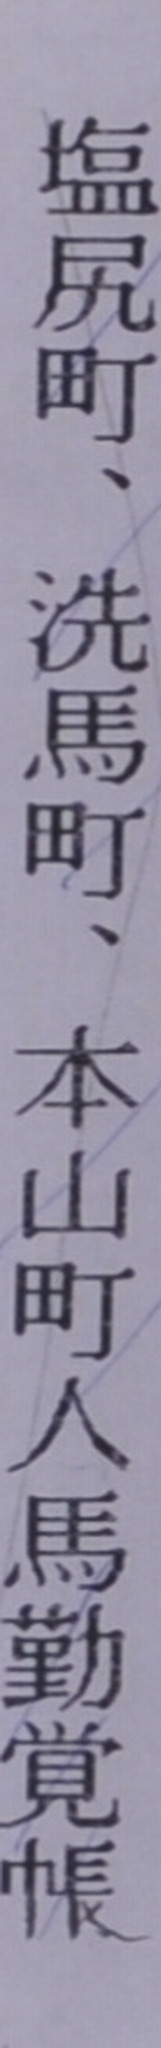塩尻町、洗馬町、本山町人馬勤覚帳

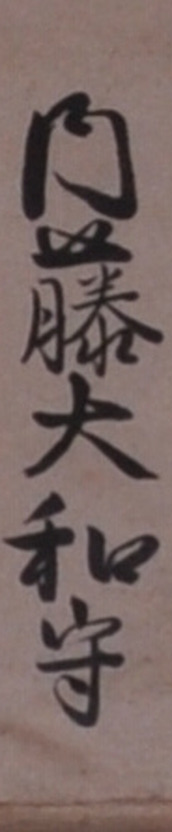内藤大和守
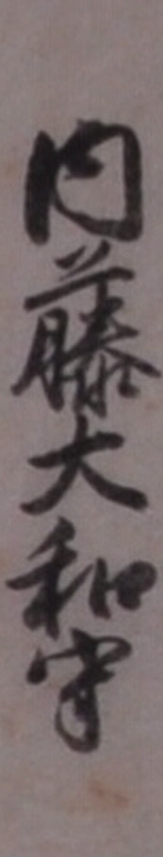内藤大和守

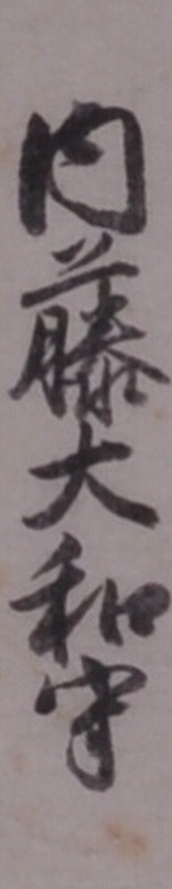内藤大和守

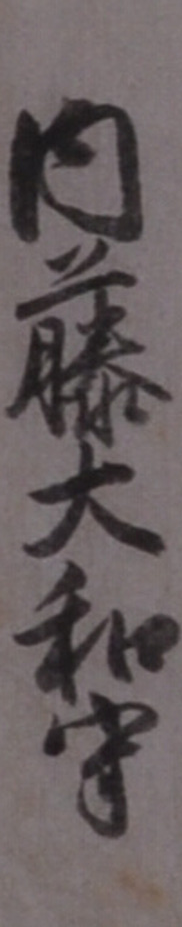内藤大和守
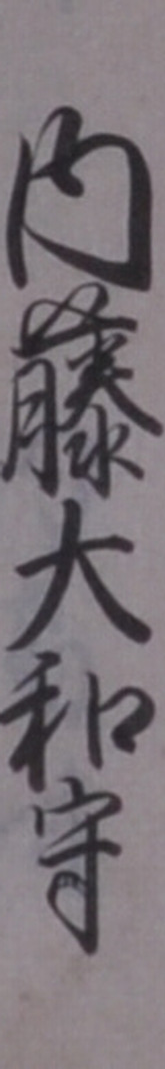内藤大和守

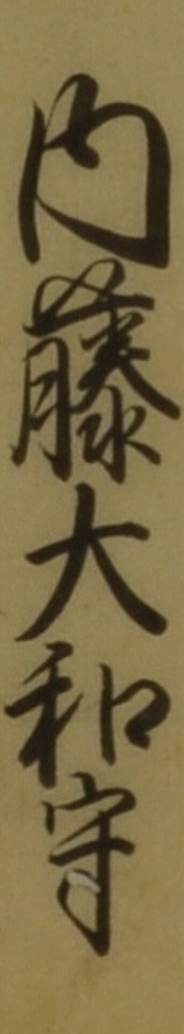内藤大和守

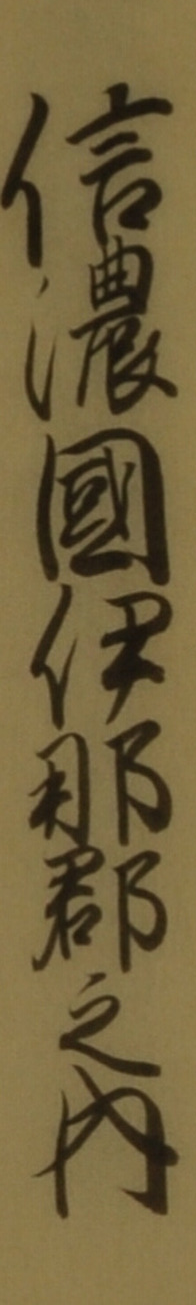信濃國伊那郡之内
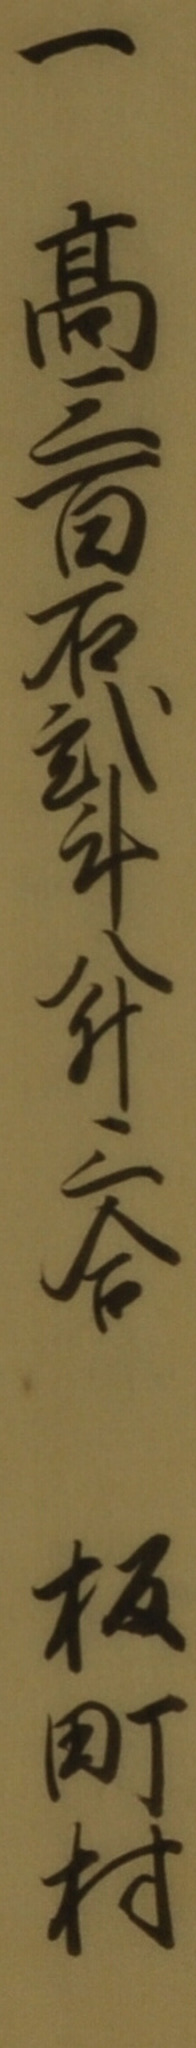一高三百石弐斗八升三合板町村
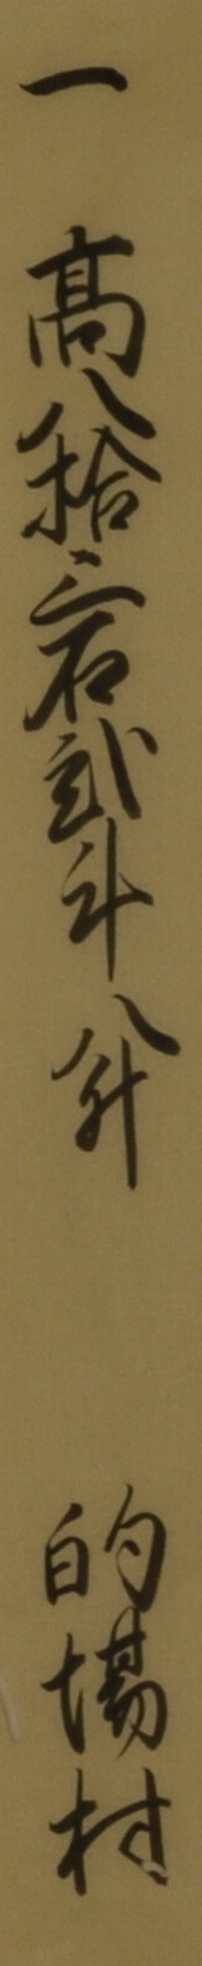一高八拾三石弐斗八升的場村
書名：信濃国伊那郡筑摩郡高遠領知郷村高辻帳
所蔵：伊那市立高遠町図書館・合同会社AMANE
